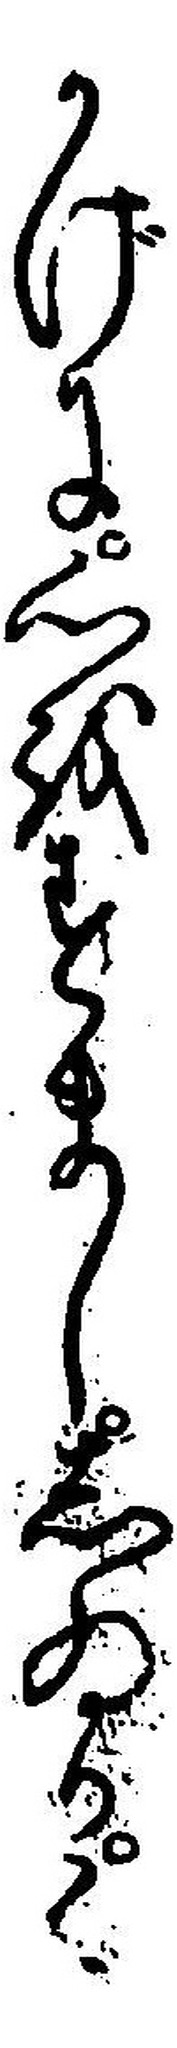かげに。心をすまし。しゐか。く
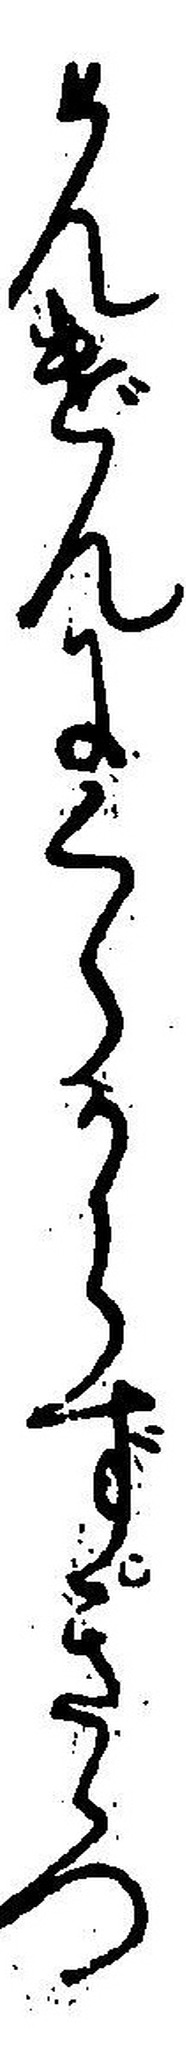わんげんにくらからず。きゝつ
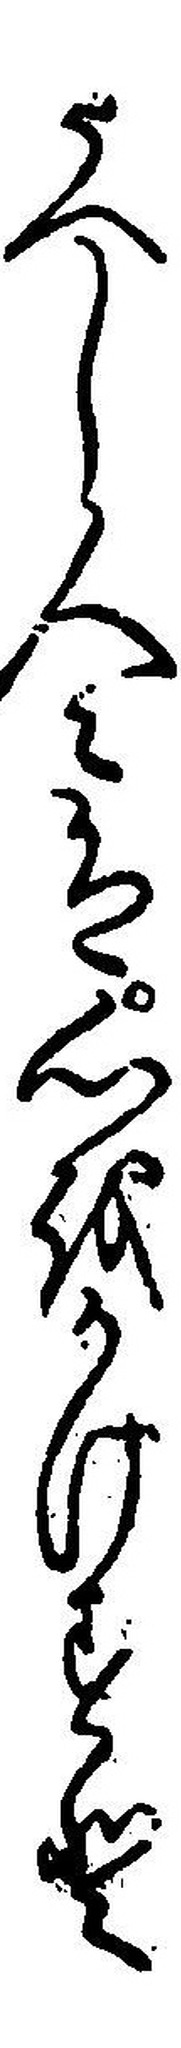へし人々は。心をかけすと
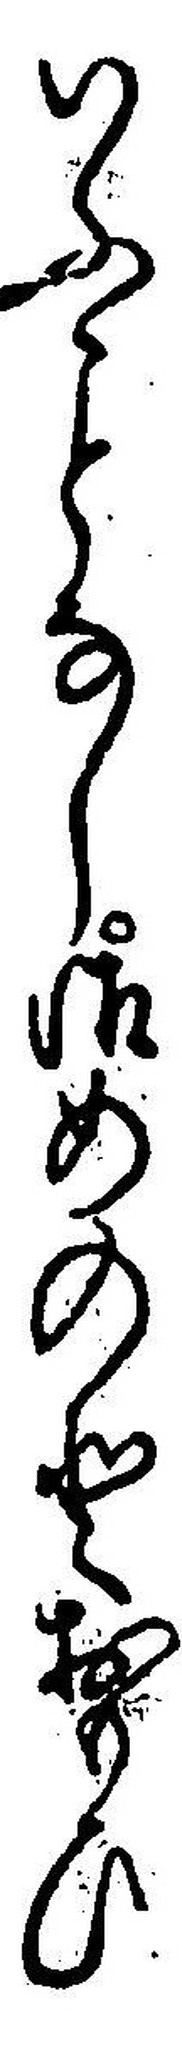いふことなし。御めのとおもひ
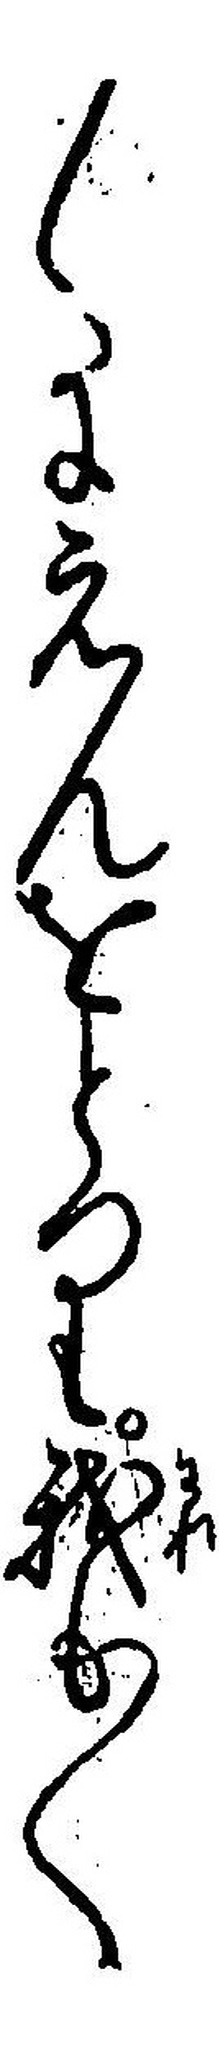〳〵にえんをとり。我も〳〵
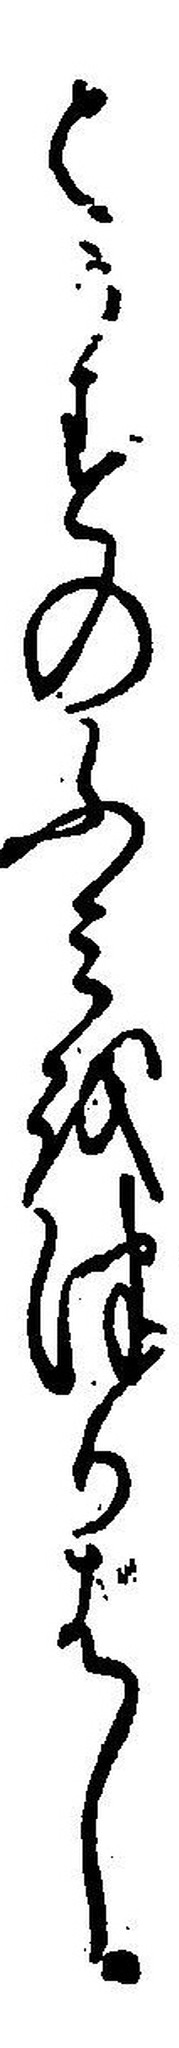とかずのふみをつかはし。
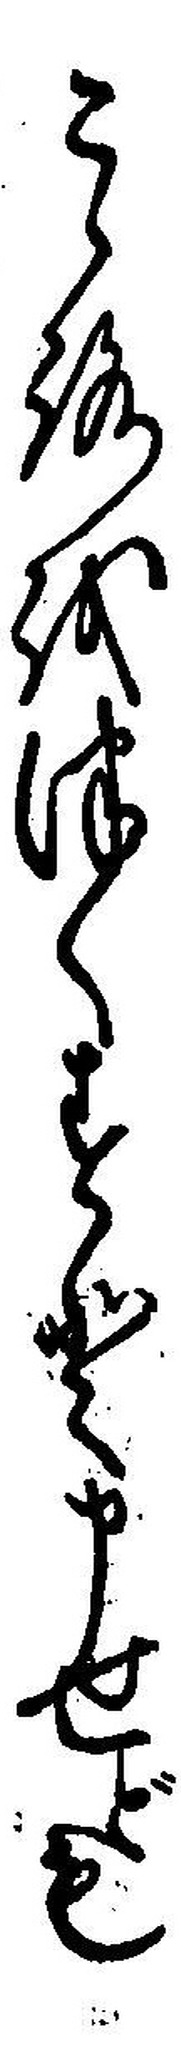こゝろをつくすと申せども
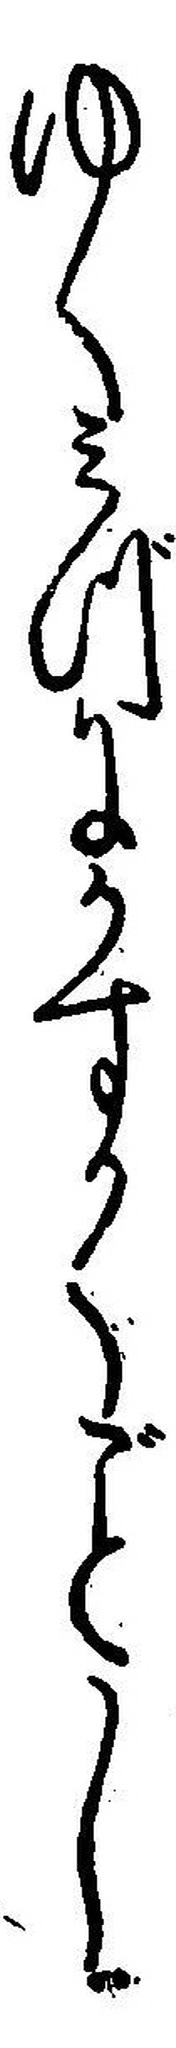ゆくみづにかすかくごとし。
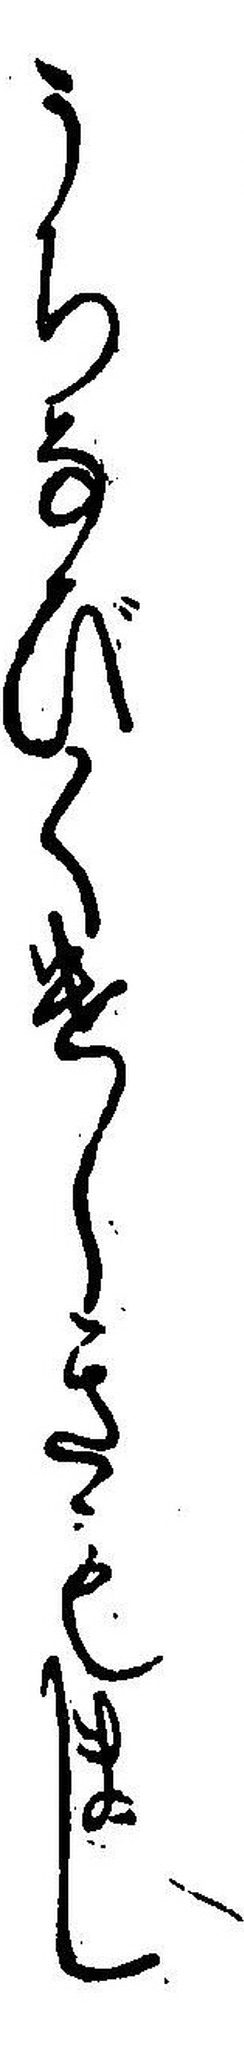うらなびくけしきもまし
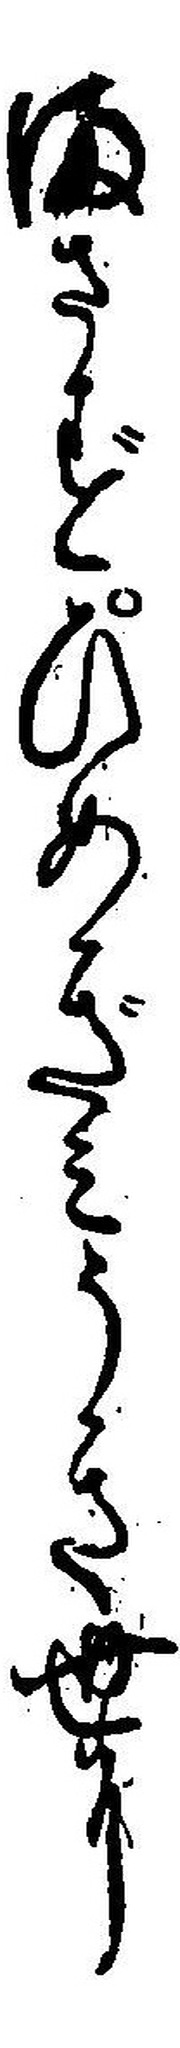まさず。ひめぎみうき世に
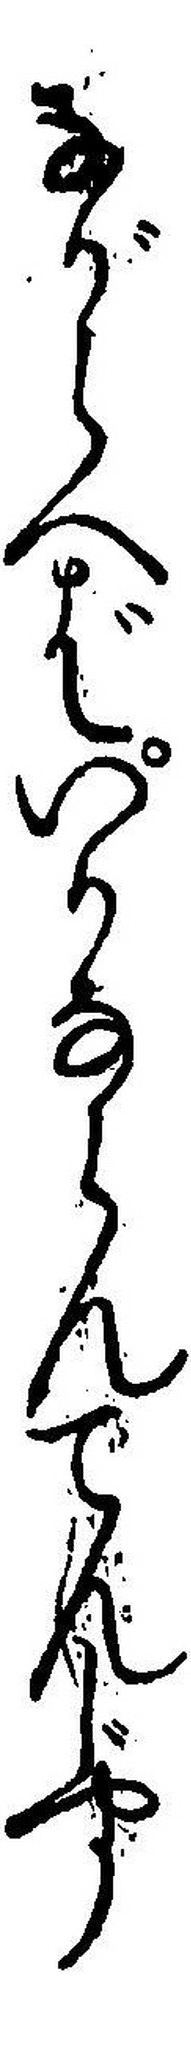ながらへば。いかならんてんじやう
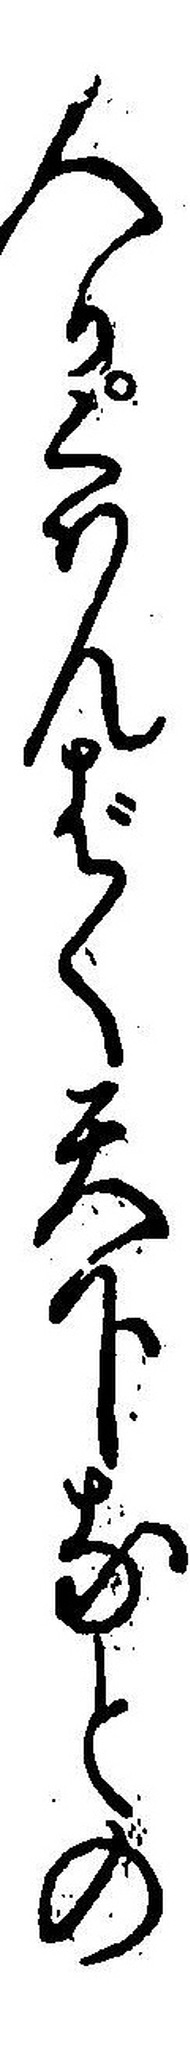人か。くはんばく天下なとの
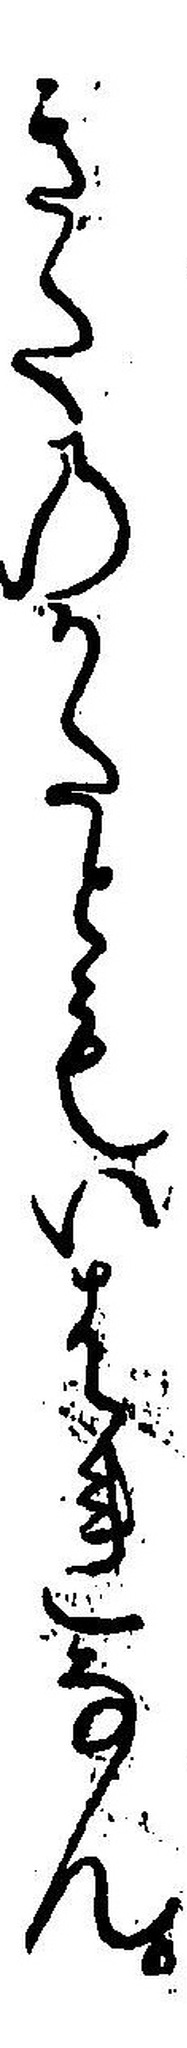きたのかたともいはれなん。
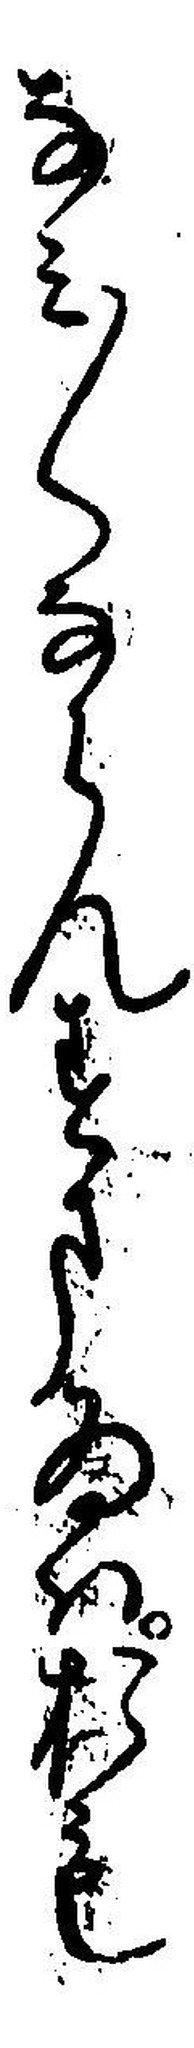なみ〳〵ならんすまゐは。おも
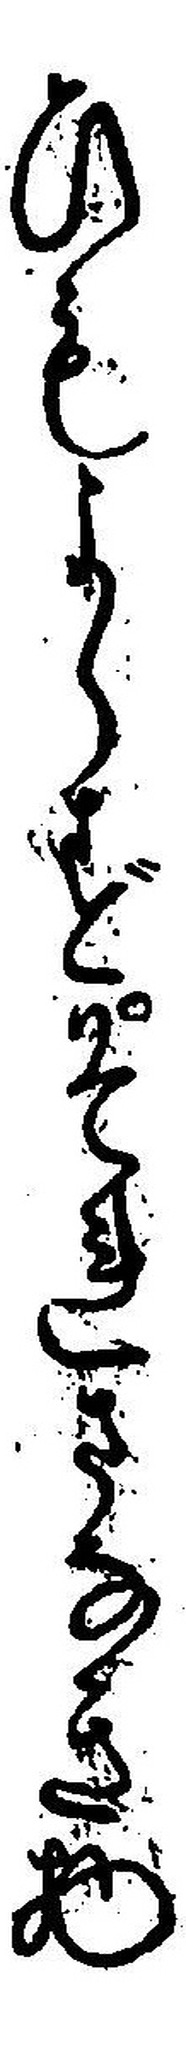ひもよらず。それさなき物
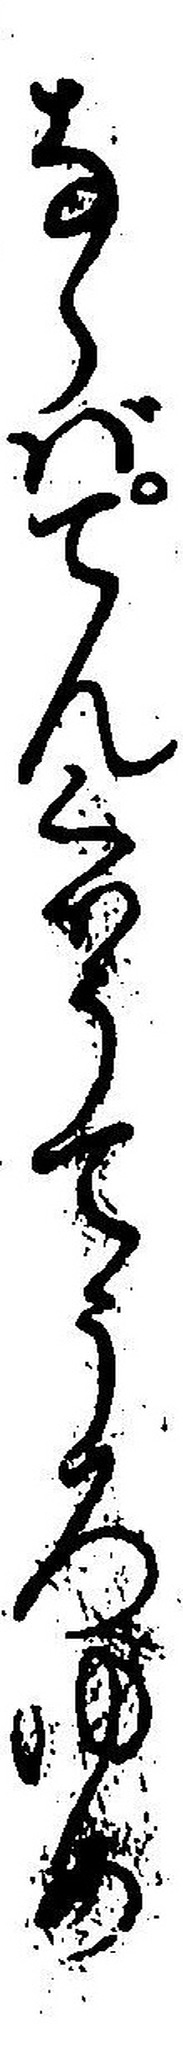ならば。てんくはうてうろゆめ
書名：木幡きつね
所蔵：東京大学総合図書館 General Library in the University of Tokyo, JAPAN
